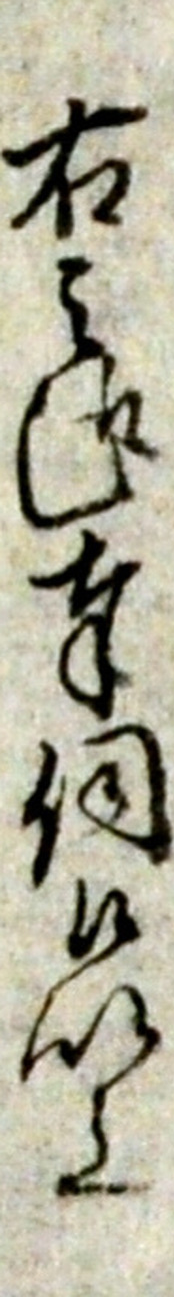右之趣奉伺候以上
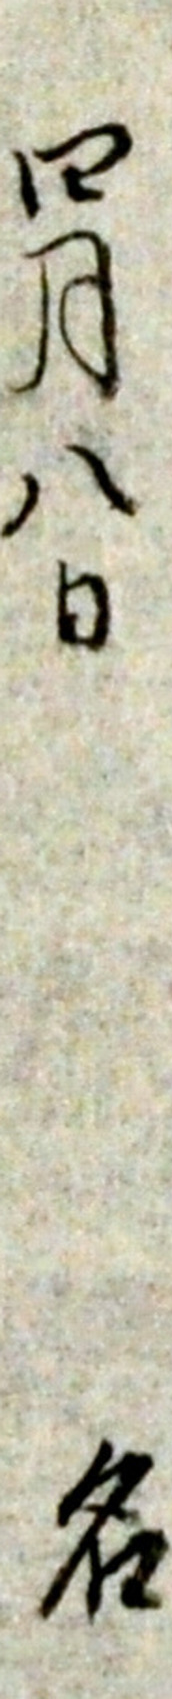四月八日名
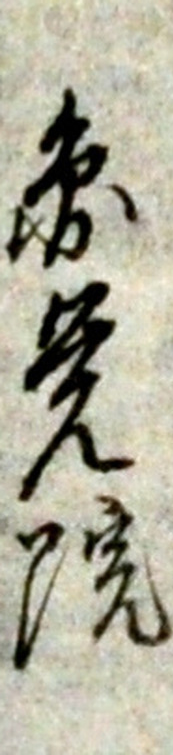円覚院
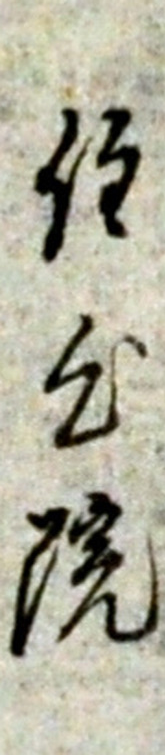住心院
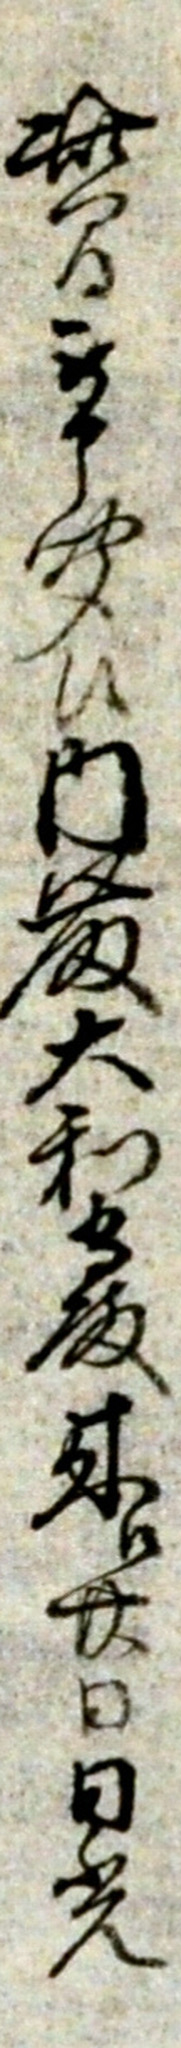此間被申聞候内藤大和守殿来ル廿日日光
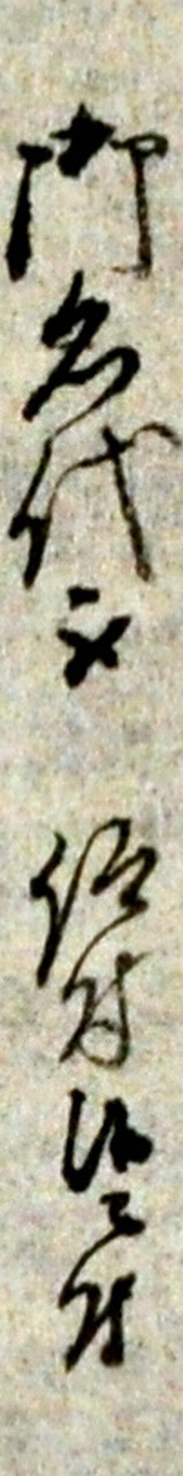御名代被仰付候ニ付
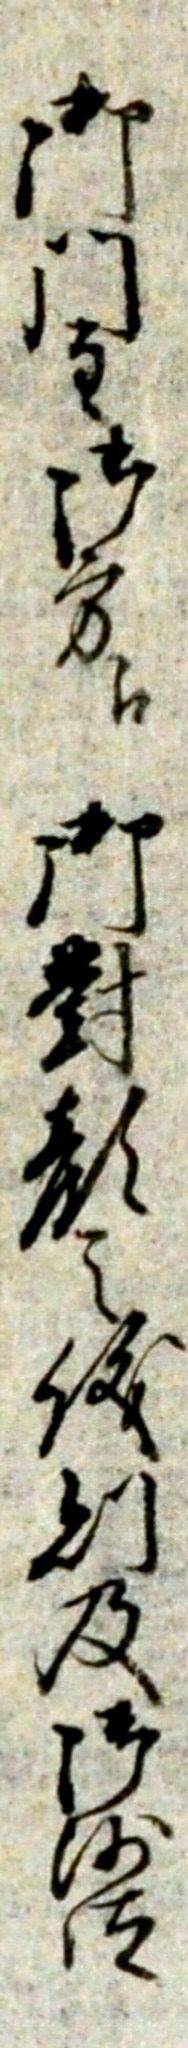御門主御方江御対顔之儀則及御沙汰
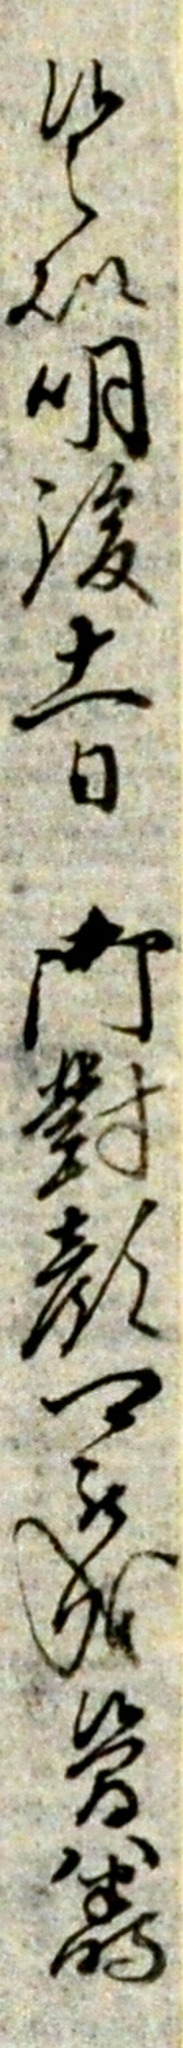候之処明後十一日御対顔可被成候間半時
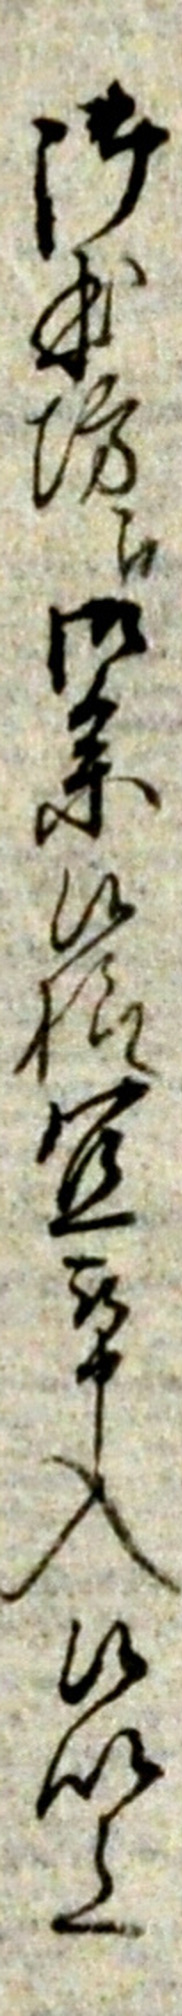御本坊江御参候様宜被申入候以上
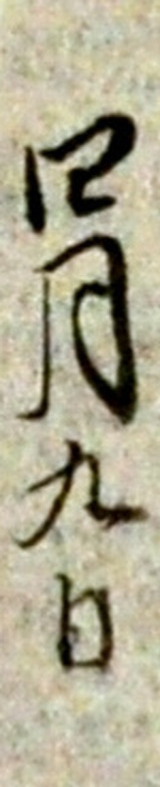四月九日
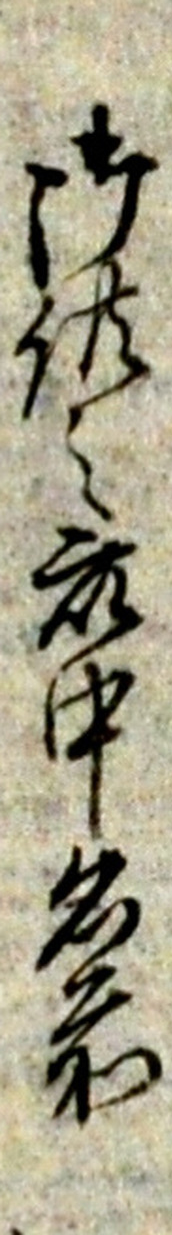御供之衆中名前
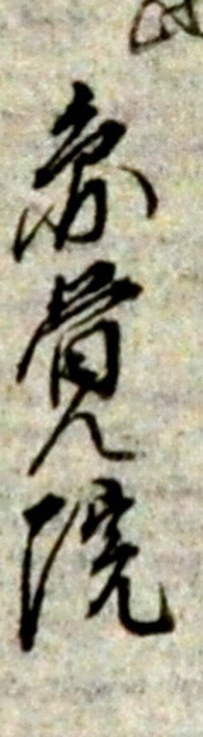円覚院
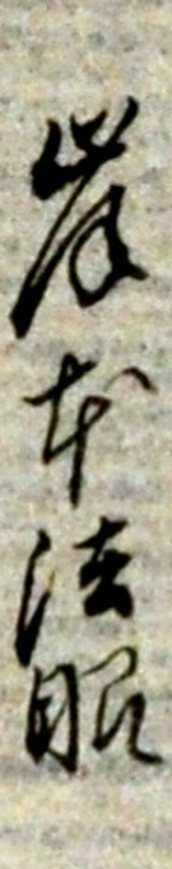岸本法眼
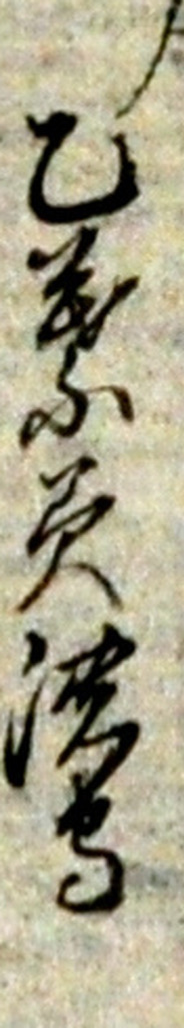乙葉美濃守
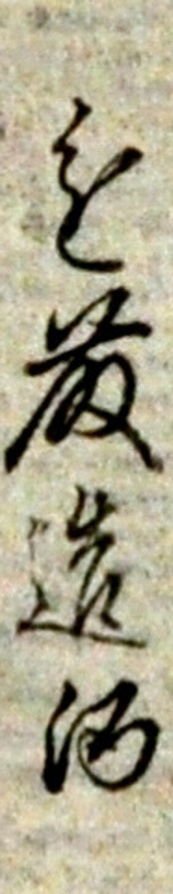進藤造酒
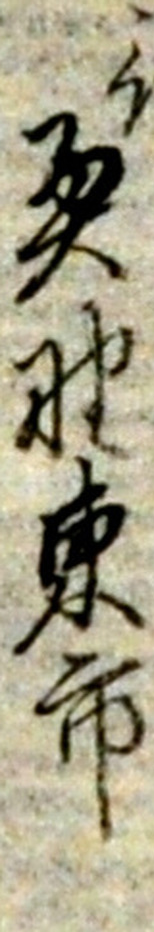奥野東市
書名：日光御名代相勤候節ノ留
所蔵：伊那市立高遠町図書館・合同会社AMANE
